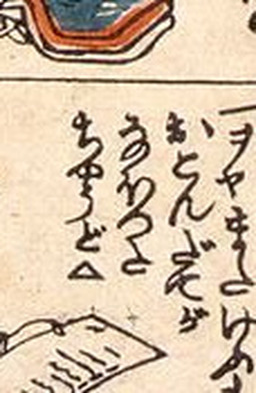なほつた
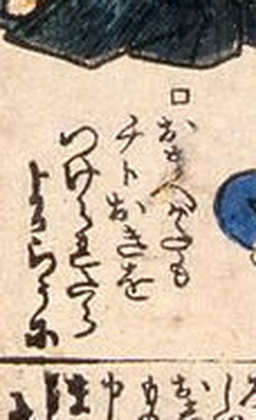チトおきを
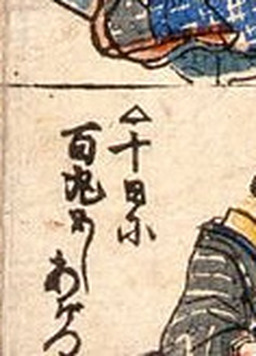十日に
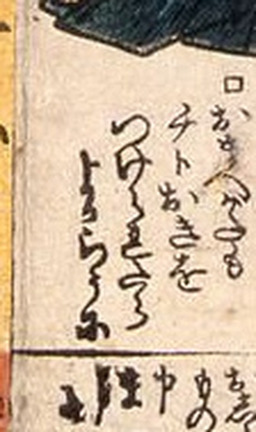つけられたら
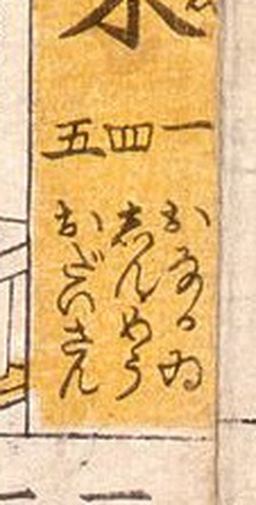五しんめう
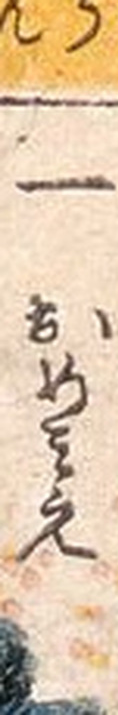一おめみえ
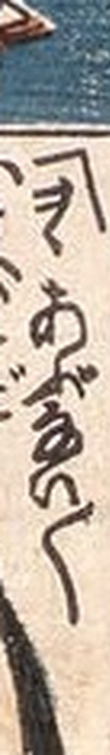〽ヲヽあぶない〳〵
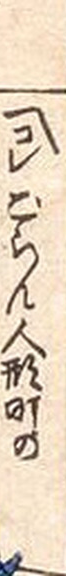〽コレごらん人形町の
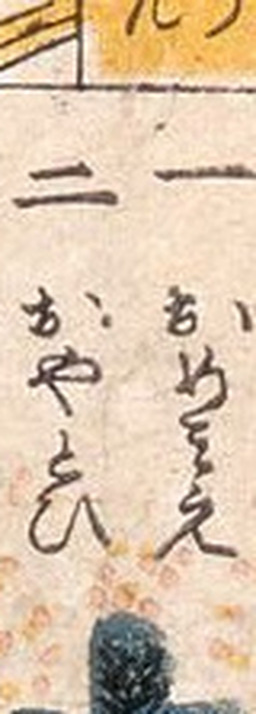二おやとひ
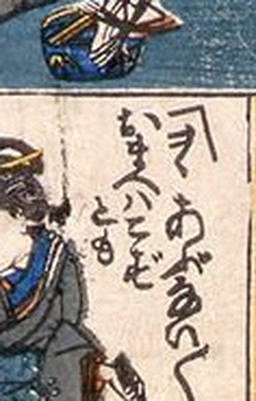おまへはこず
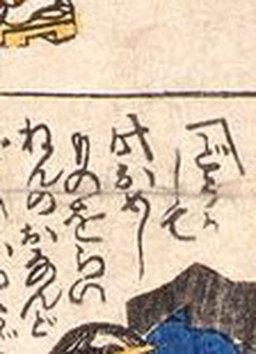此おめし
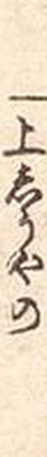上しうやの
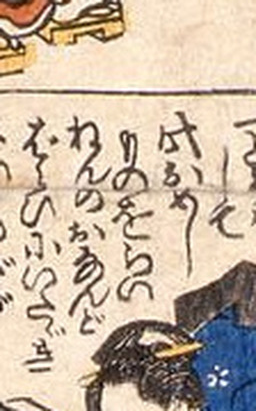ものをらい
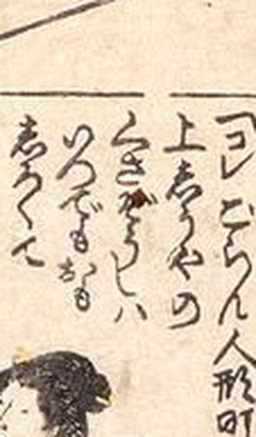くさぞうしは
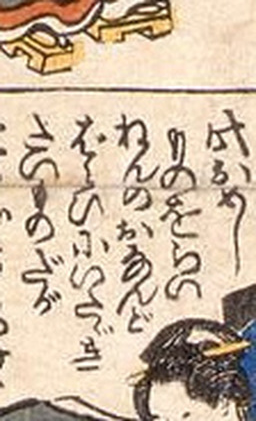ねんのおなんど
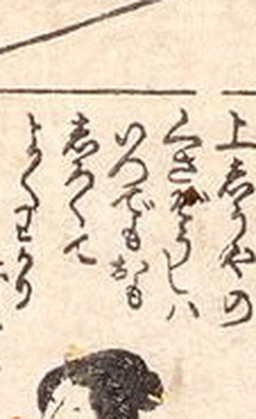いつでもおも
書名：奥奉公出世双六
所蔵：東京学芸大学教育コンテンツアーカイブ
